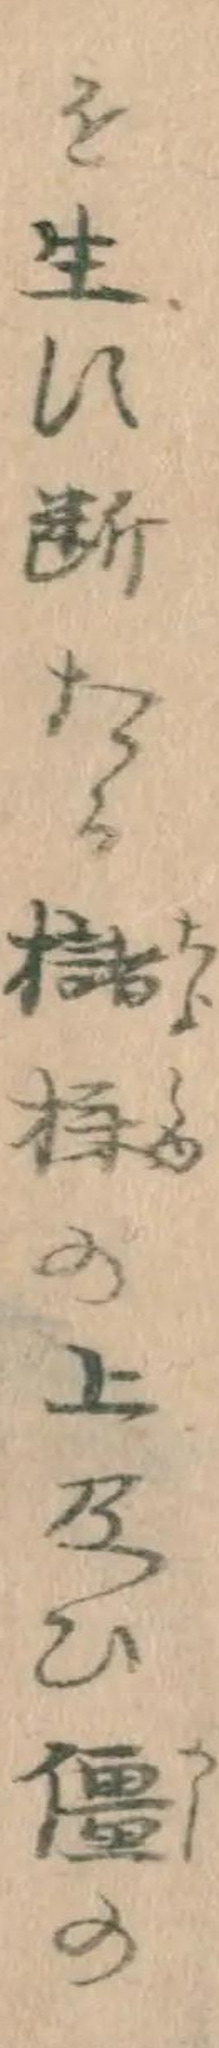を生す断たる櫧株の上及ひ僵の
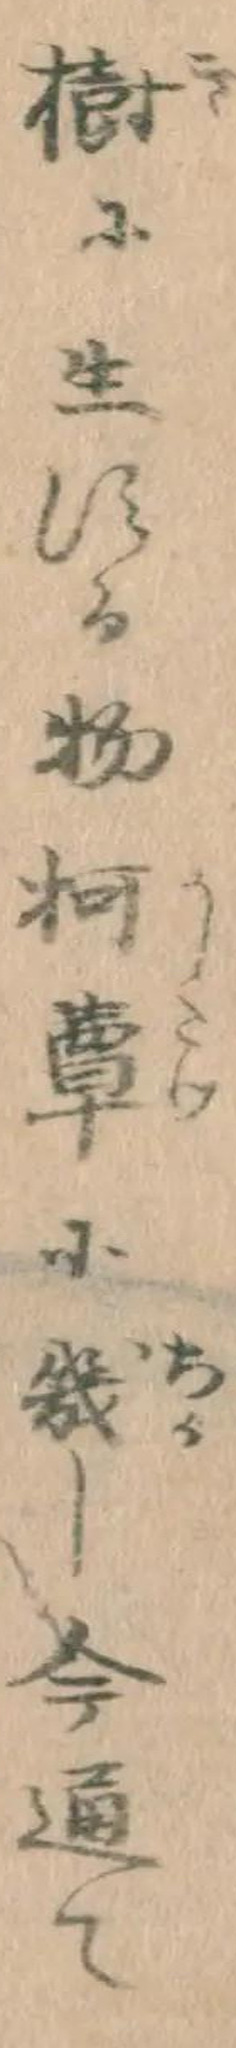樹に生する物柯蕈に幾し今通て
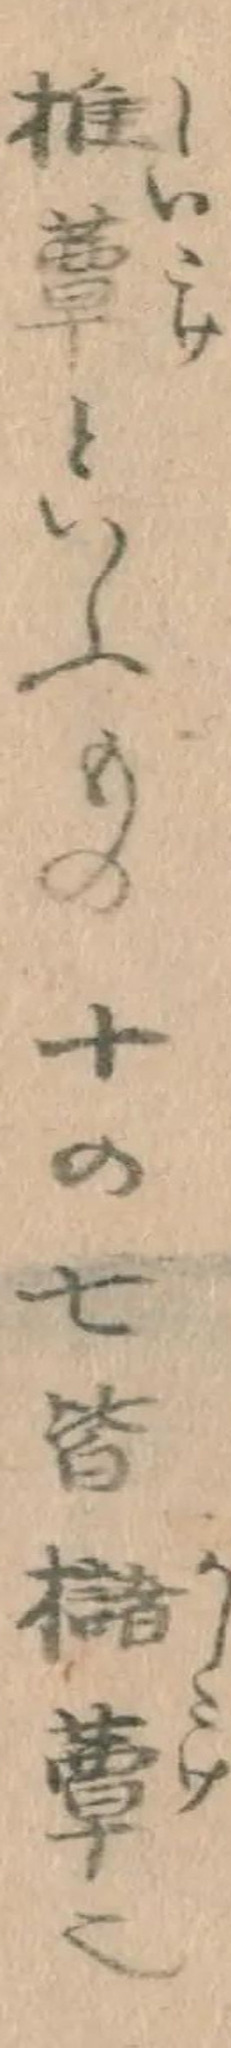椎蕈といふもの十の七皆櫧蕈也
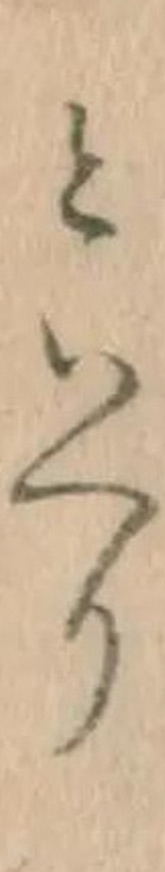といへり
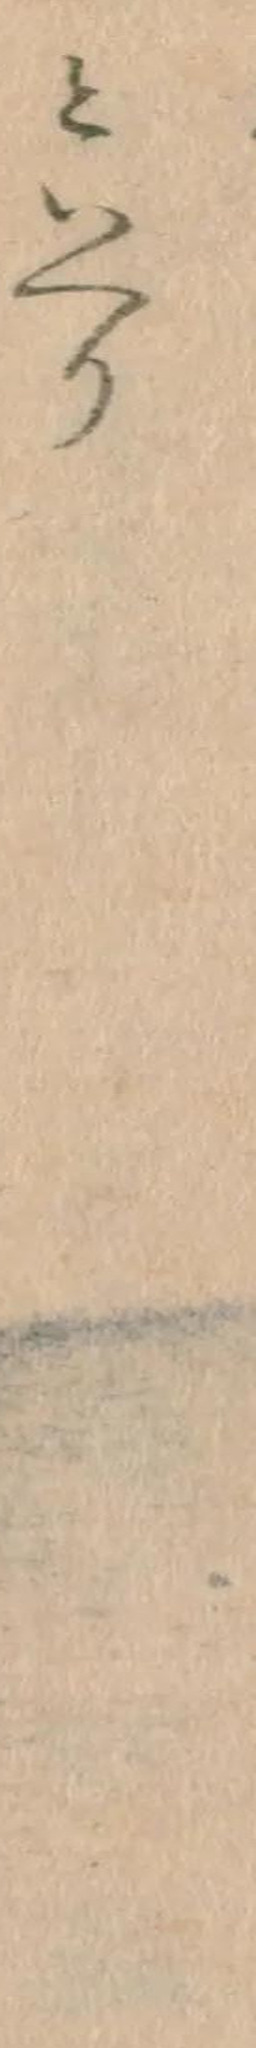といへり
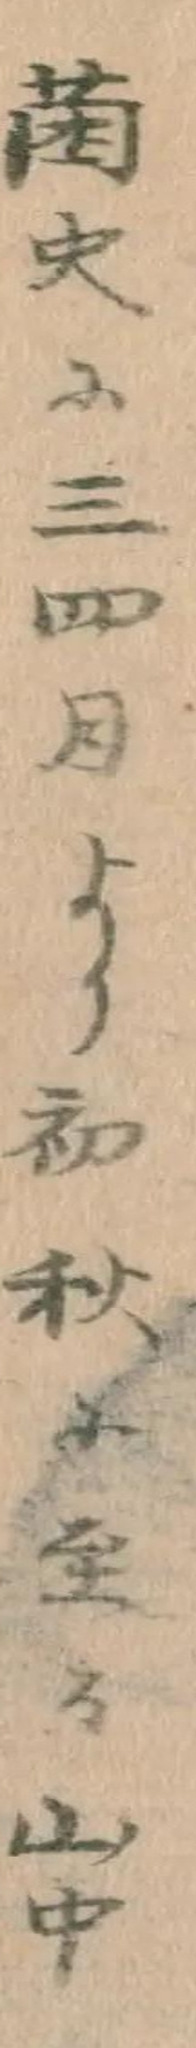菌史に三四月より初秋に至る山中
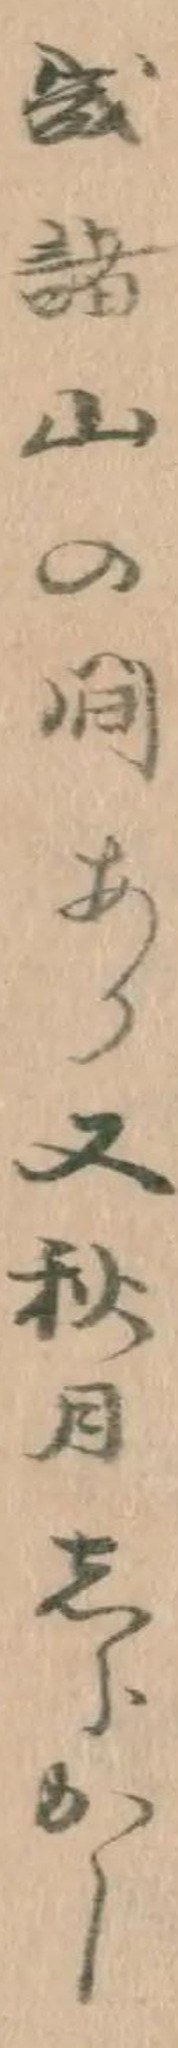幾諸山の間あり又秋月しらかし
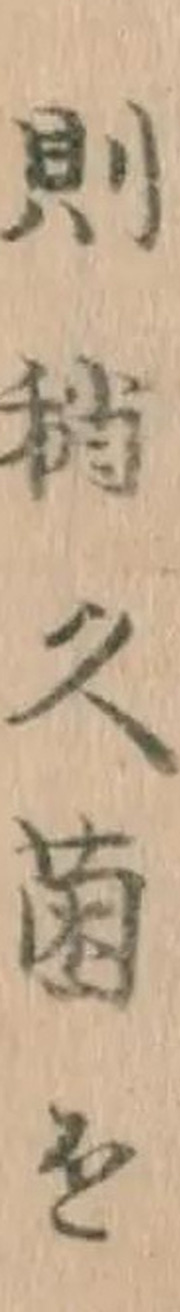則稍久菌を
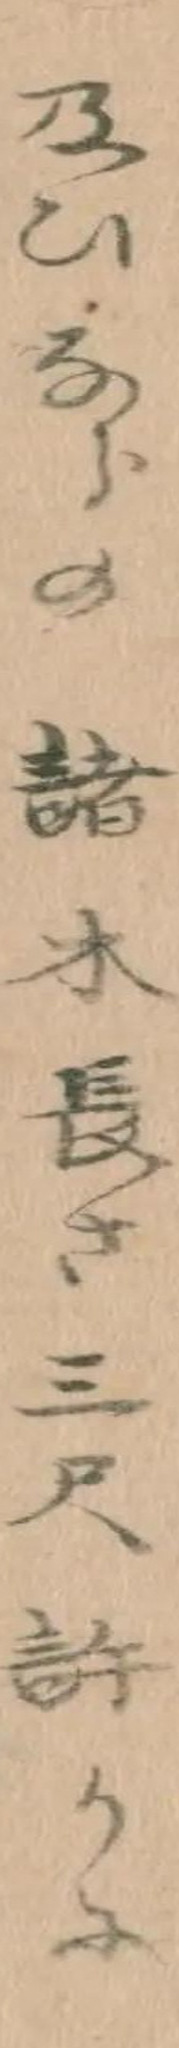及ひならの諸木長さ三尺許りに
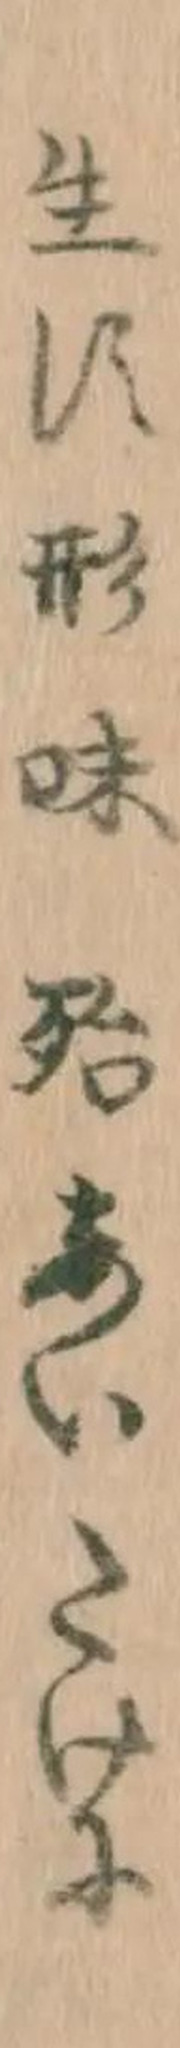生す形味殆いたけに
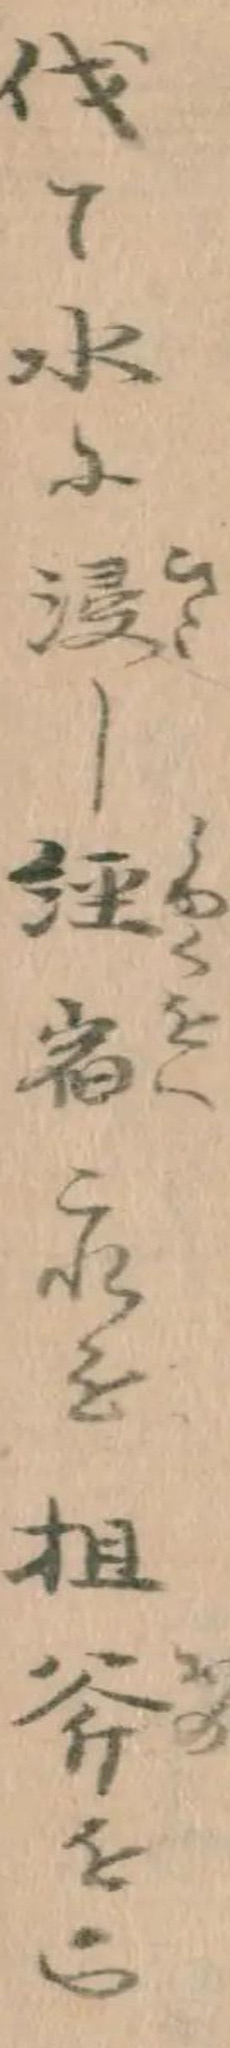伐て水に浸し経宿これを担斧を・○
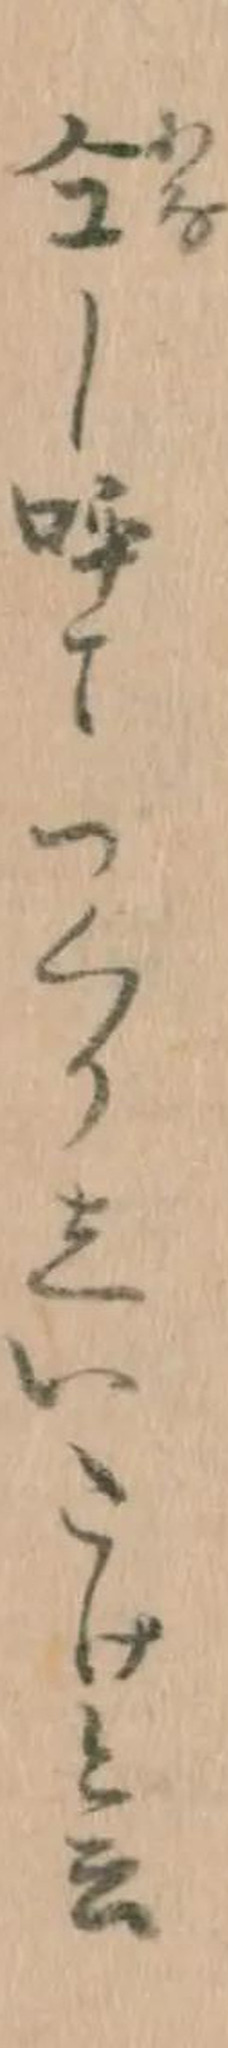同し呼てつくりしいたけと云
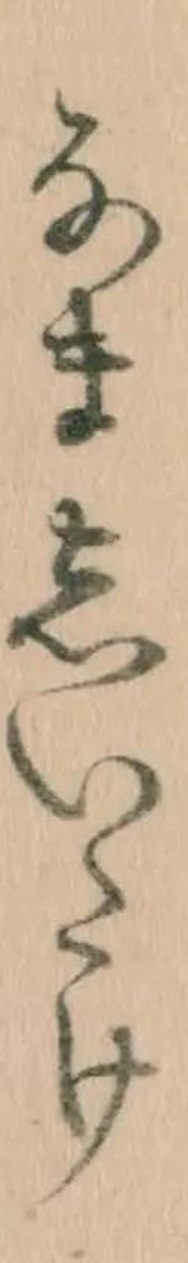なましいたけ
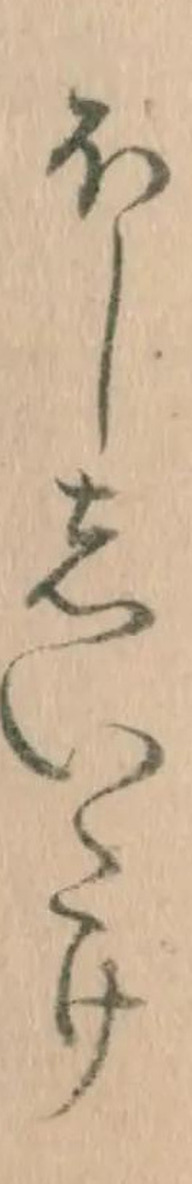ほししいたけ

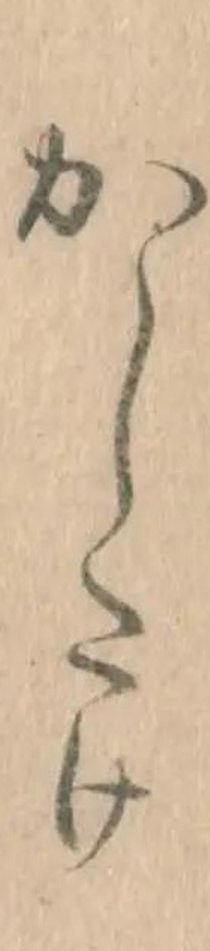かしたけ
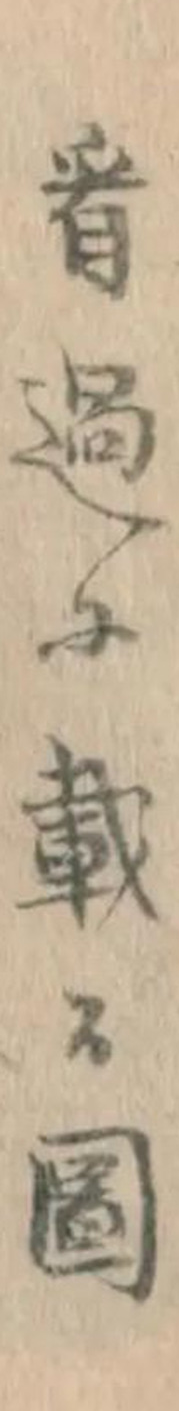看過に載る図
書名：本草図譜. 巻55-57
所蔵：国立国会図書館 National Diet Library, JAPAN
